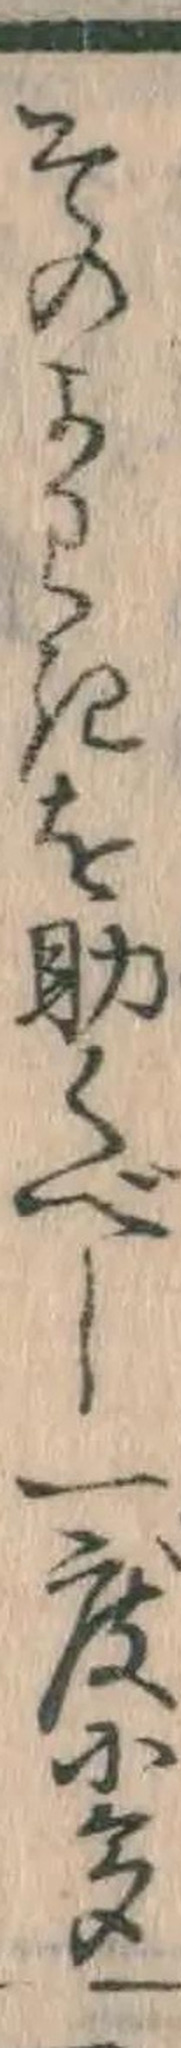そのよわきを助くべし一度に多
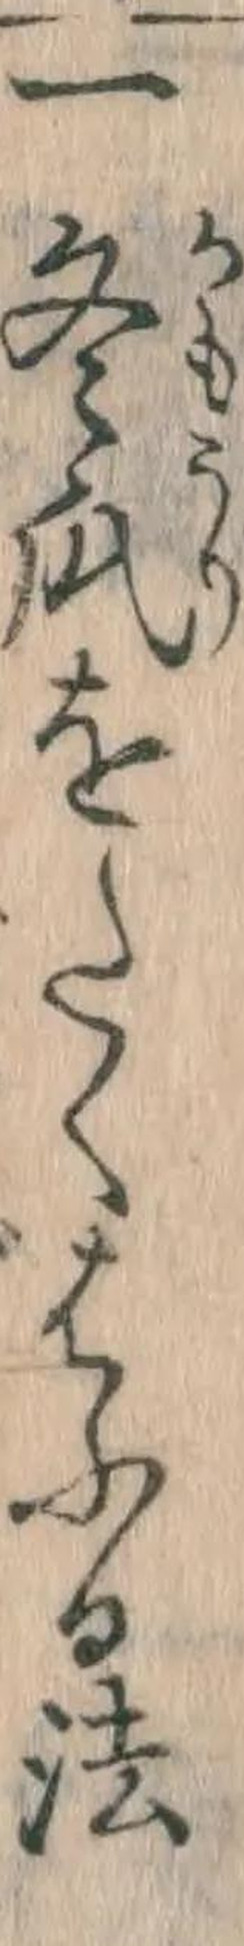一桃をたくはふる法
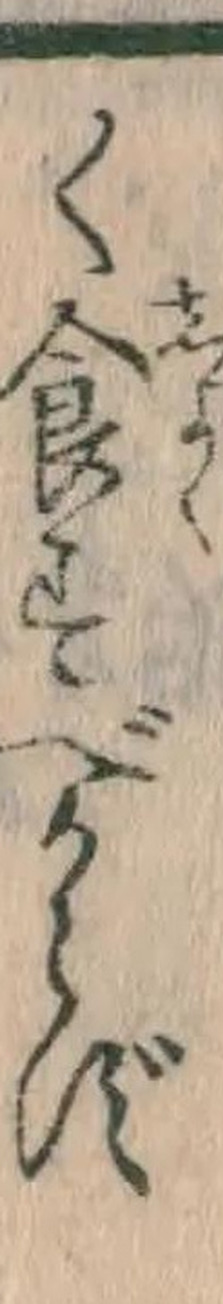く食すべからず
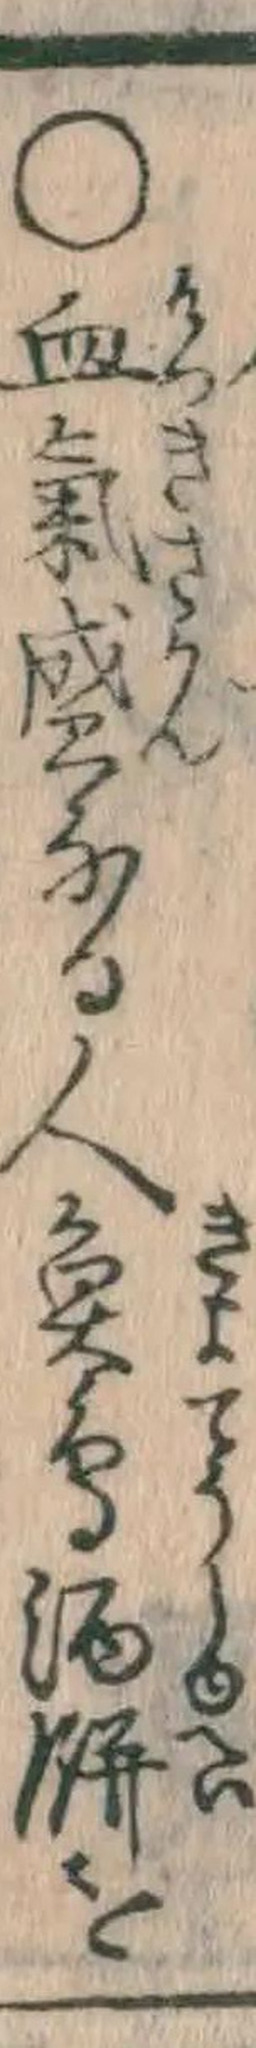○血気盛なる人魚鳥酒餅を
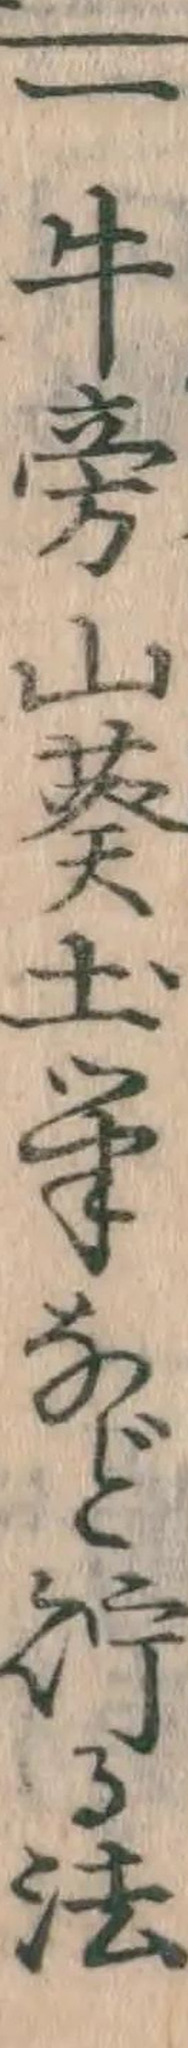一牛蒡山葵土筆など貯る法
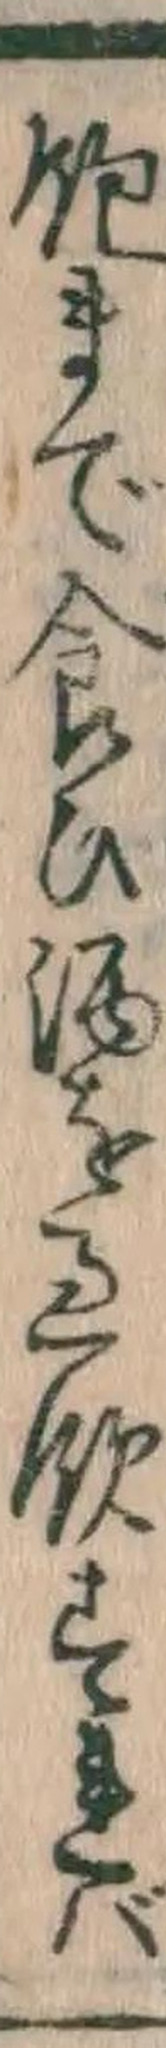飽まで食ひ酒を過飲すれば
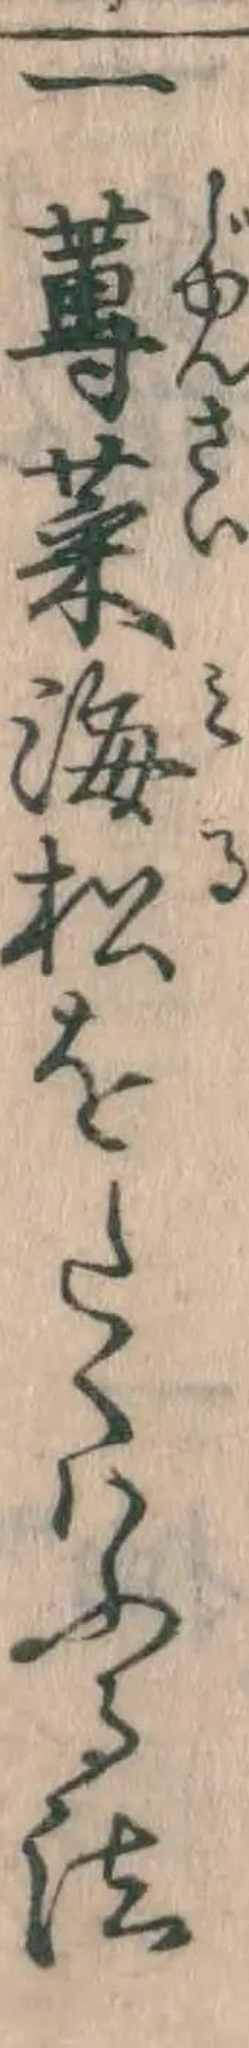一蓴菜海松をたくはふる法
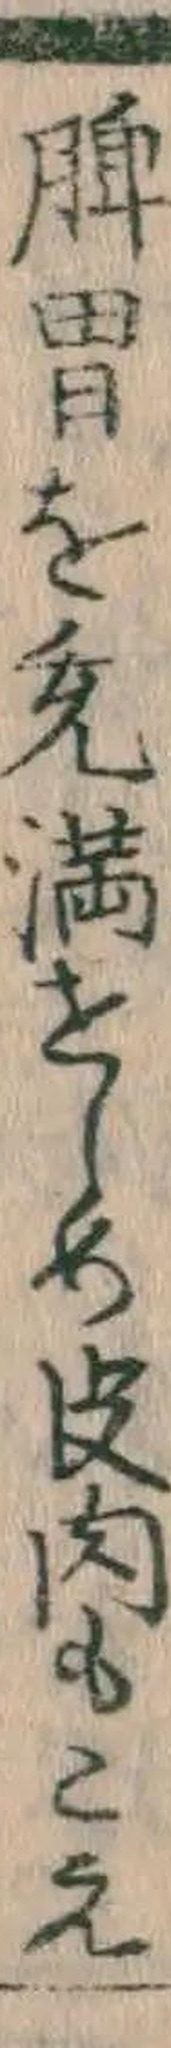脾胃を充満せしめ皮肉もこえ
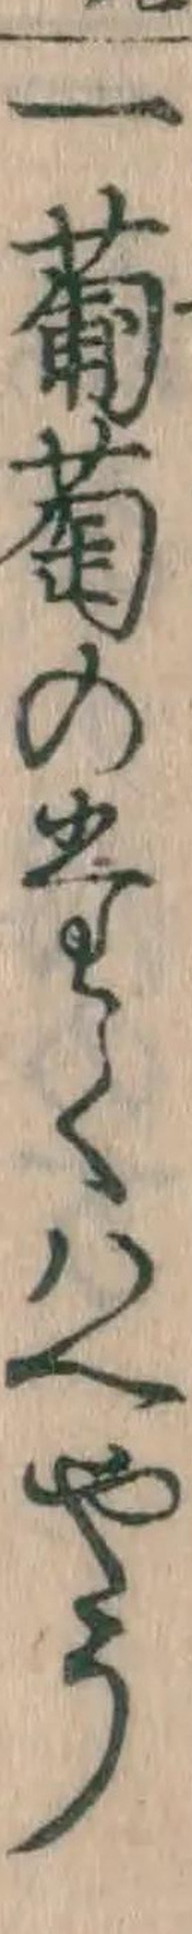一葡萄のたくはへやう
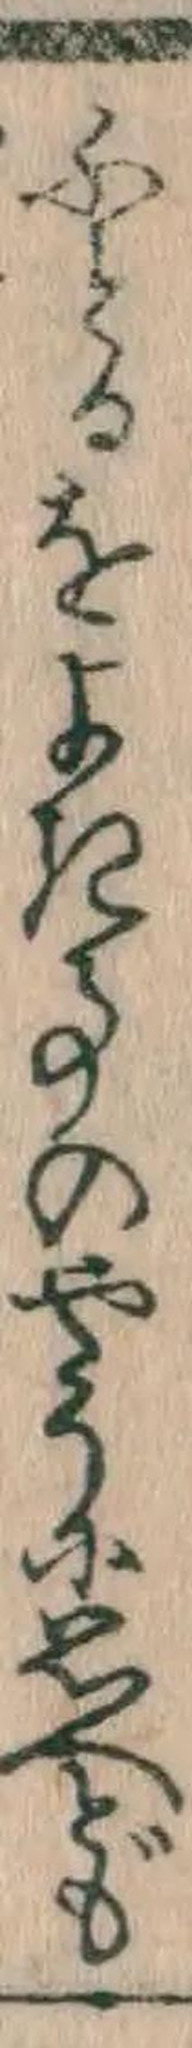ふとるをよき事のやうに思へども
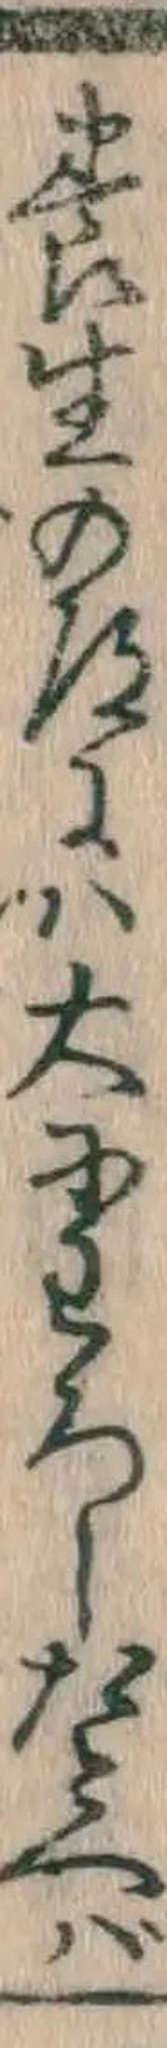養生の道には大にわろしたとへば
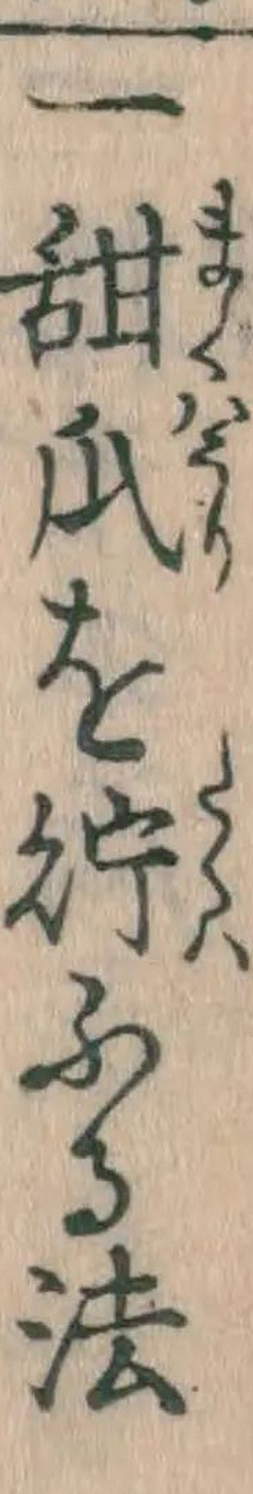一甜瓜を貯ふる法
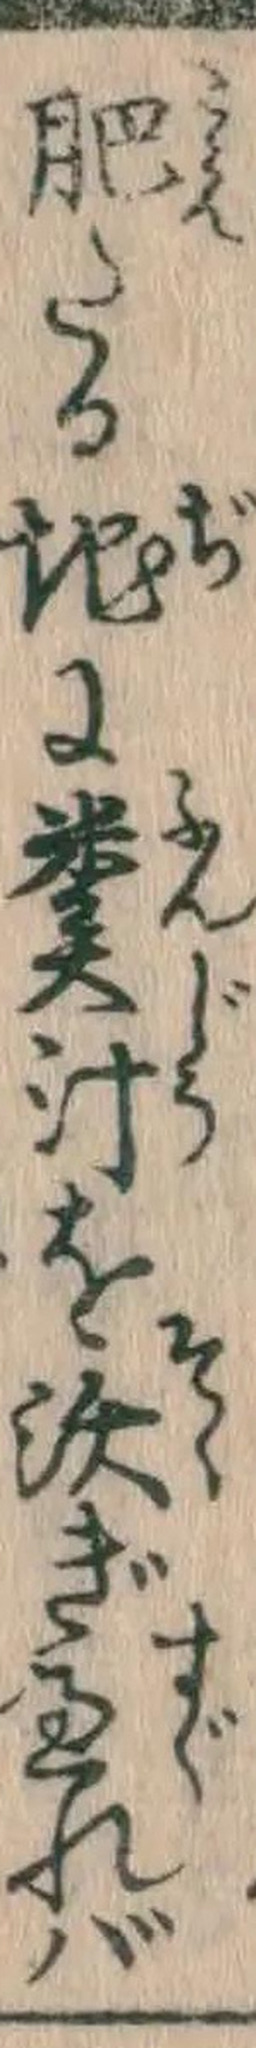肥たる地に糞汁を沃ぎ過れば
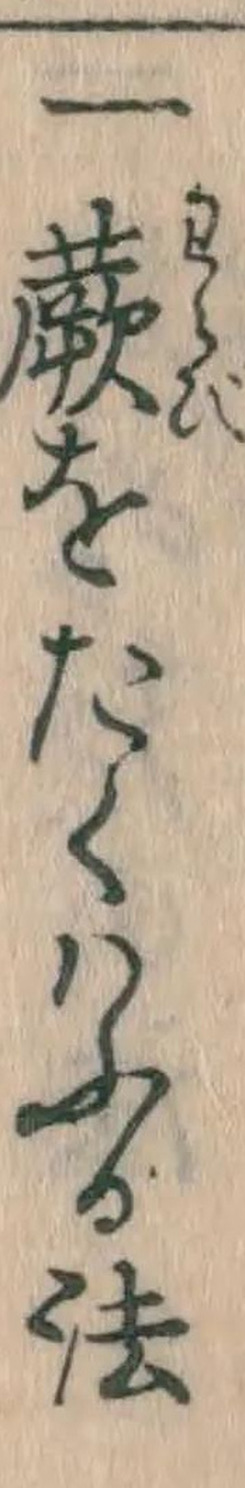一桃をたくはふる法
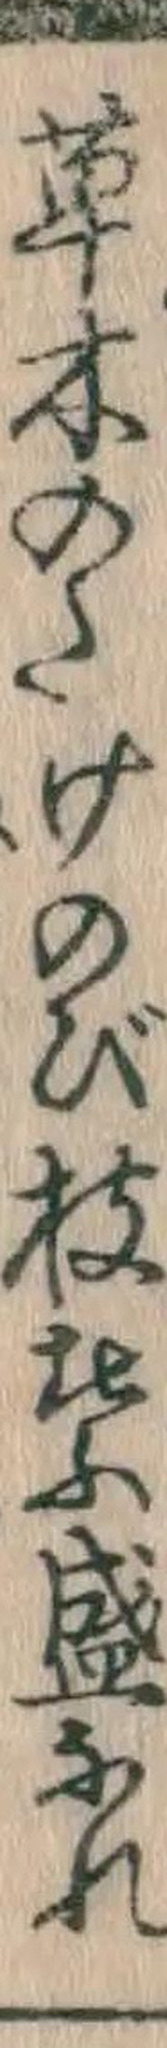草木のたけのび枝葉盛なれ
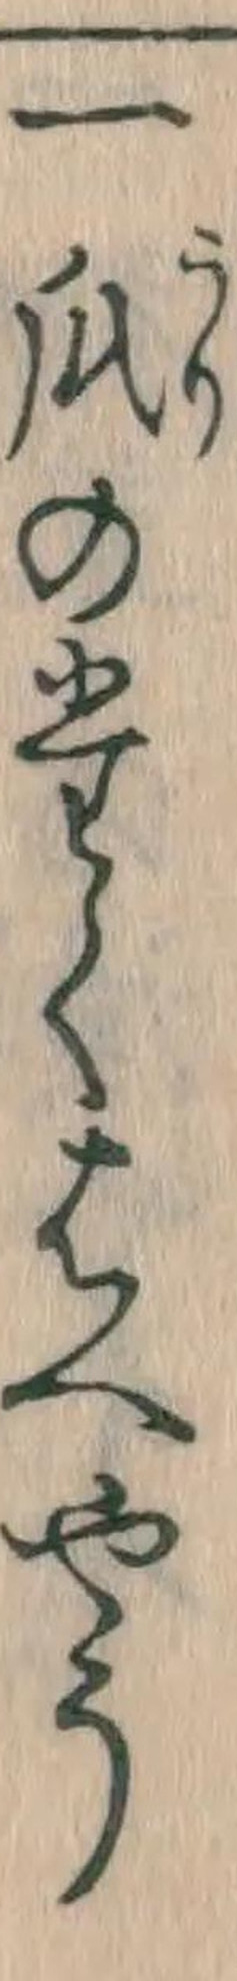一瓜のたくはへやう
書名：広益秘事大全 3巻. [1]
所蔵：国立国会図書館 National Diet Library, JAPAN
